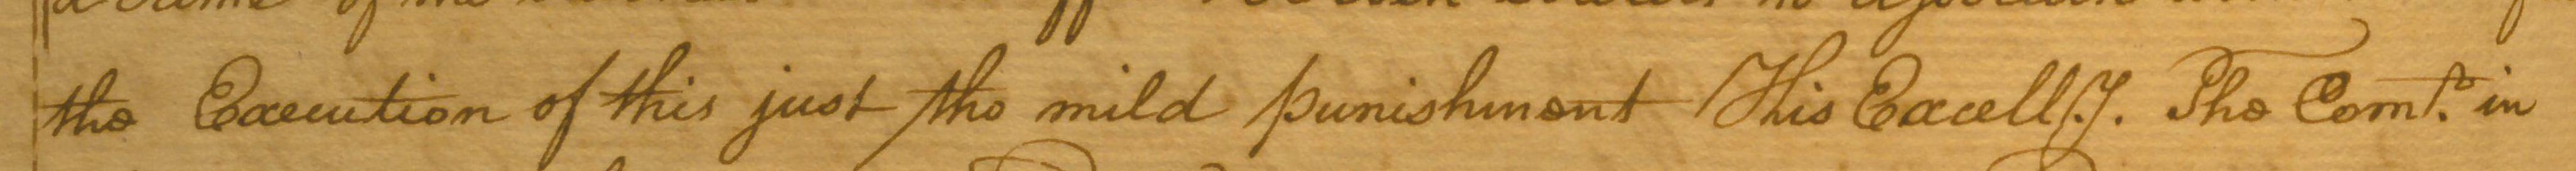the Execution of this just tho mild punishment His Excell^y. The Com^r. in
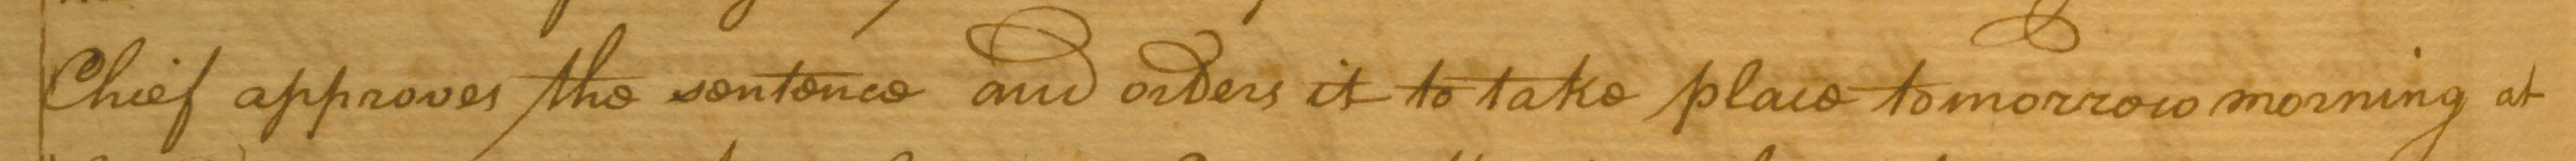Chief approves the sentence and orders it to take place tomorrow morning at
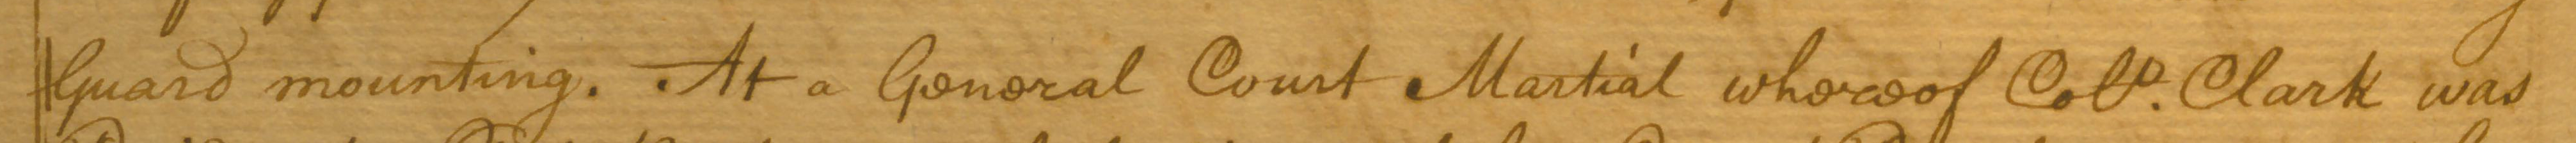Guard mounting. At a General Court Martial whereof Col^o. Clark was
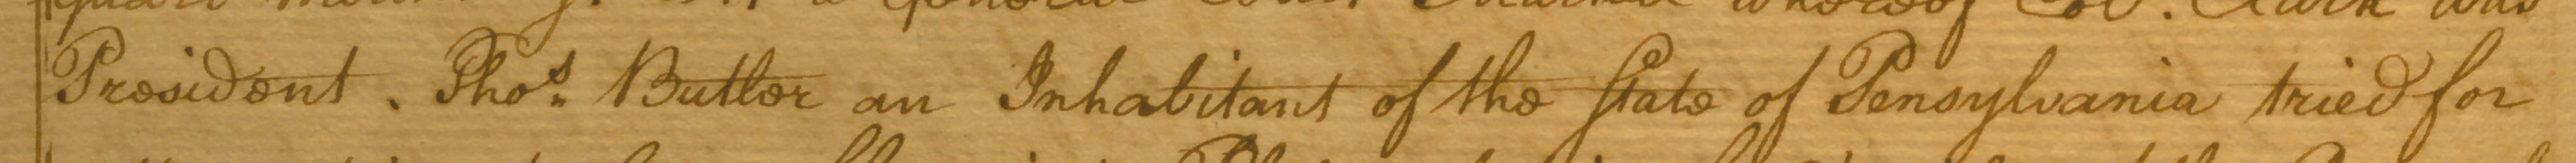President. Tho^s. Butler an Inhabitant of the state of Pensylvania tried for
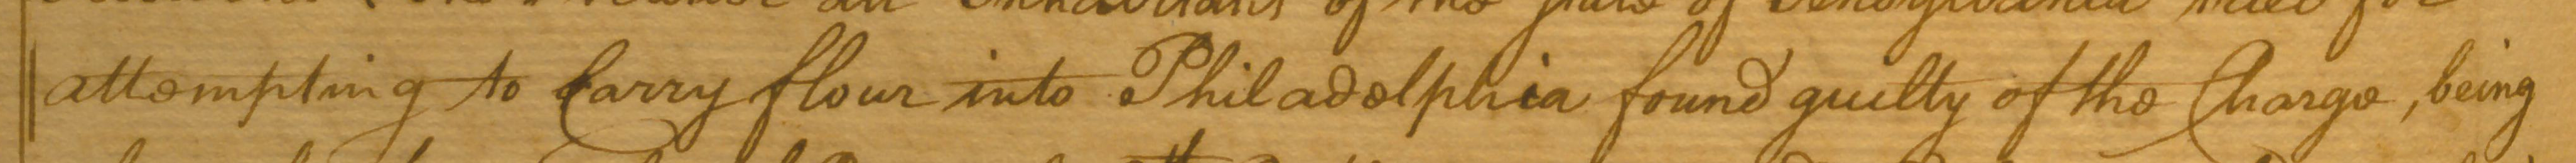attempting to Carry flour into Philadelphia found guilty of the Charge, being
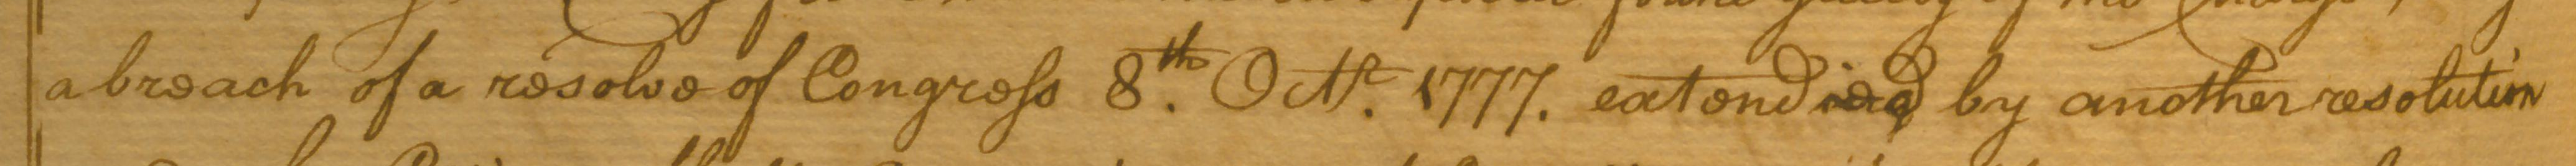a breach of a resolve of Congress 8^th. Oct^r. 1777. extended by another resolution
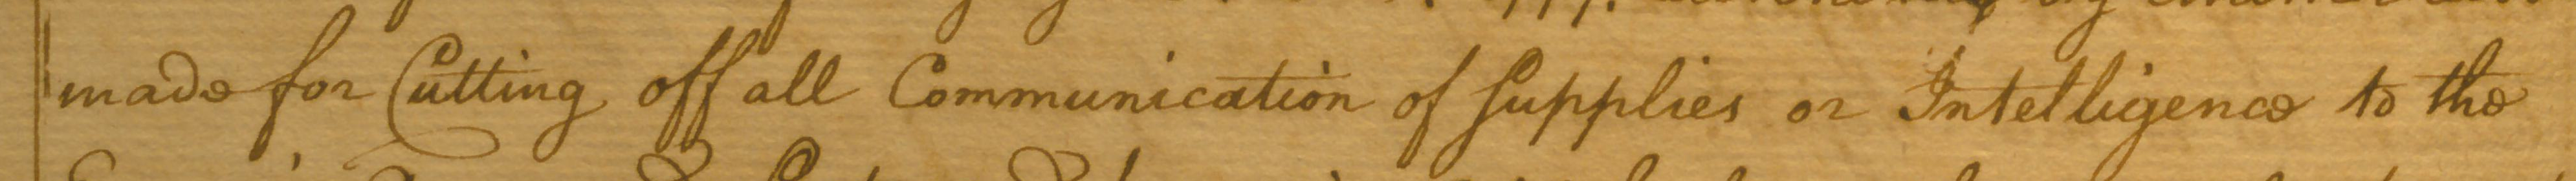made for Cutting off all Communication of supplies or Intelligence to the
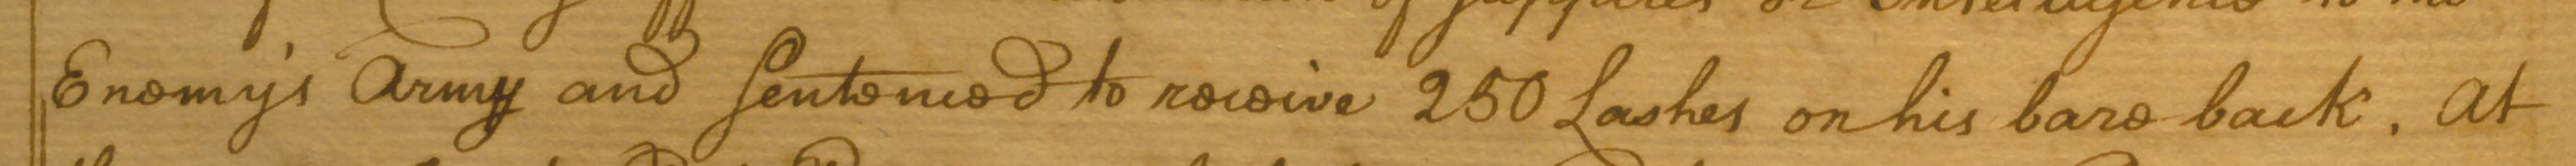Enemy's Army and sentenced to receive 250 Lashes on his bare back. At
